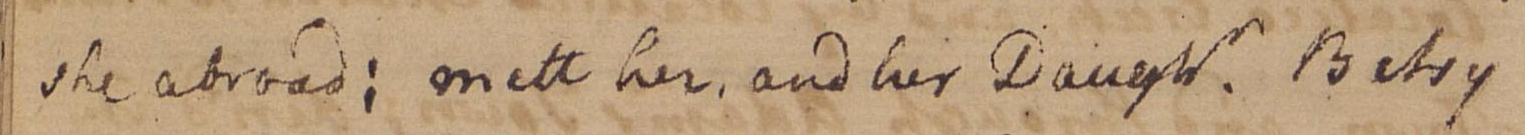she abroad; mett her, and her Daugh^r. Betsy
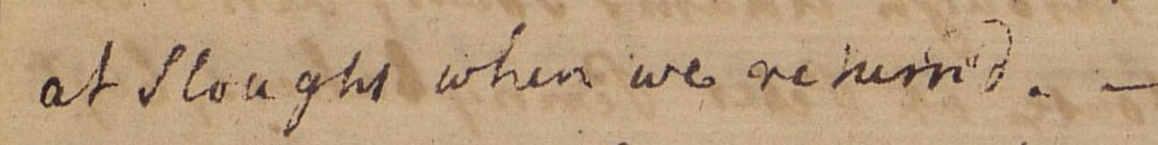at Sloughs when we return'd.-
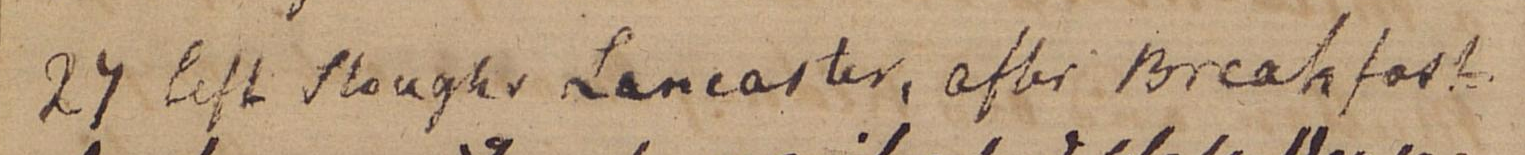27 left Sloughs Lancaster, after Breakfast
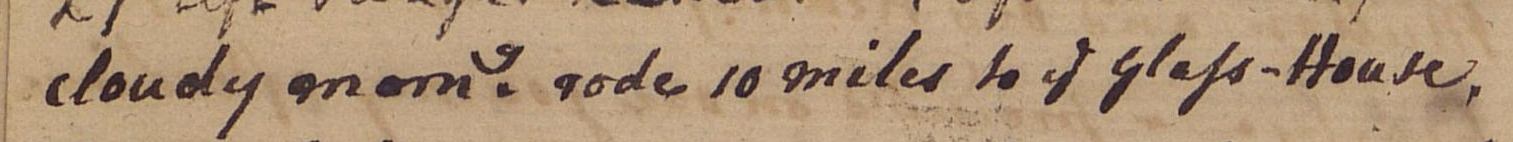cloudy morn^g. rode 10 miles to y^e glass- House,
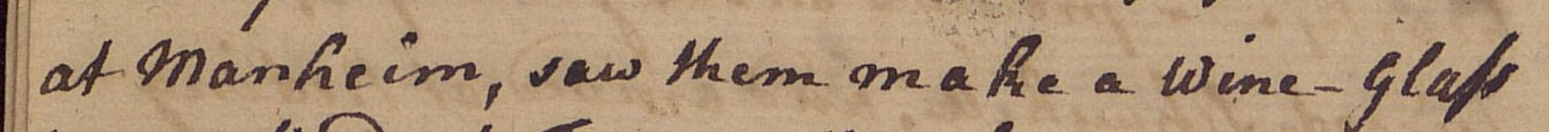at Manheim, saw them make a Wine-Glass
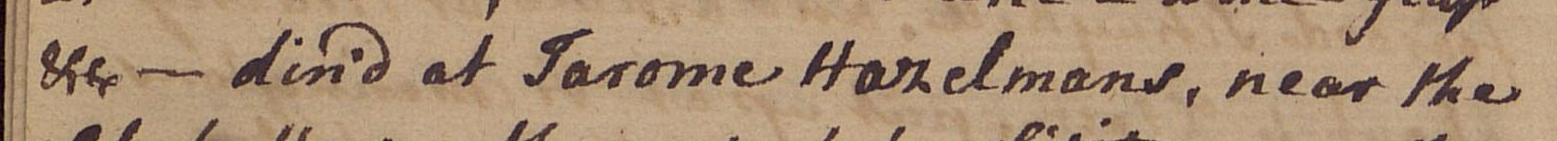&e- din'd at Jarome Hazelmans, near the
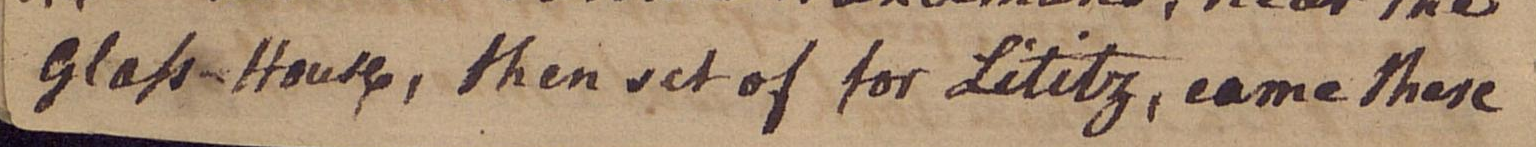Glass- House, then set of for Lititz, came there
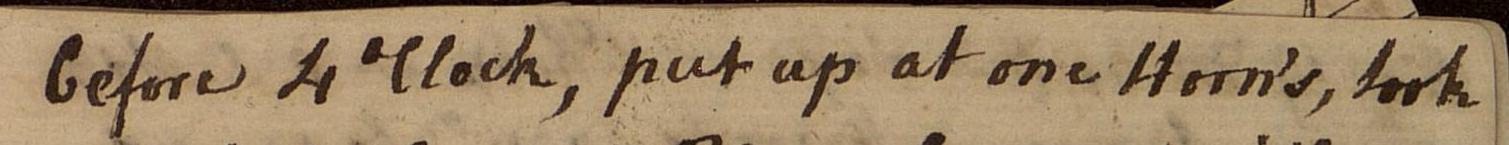before 4 oClock, put up at one Horn's, took
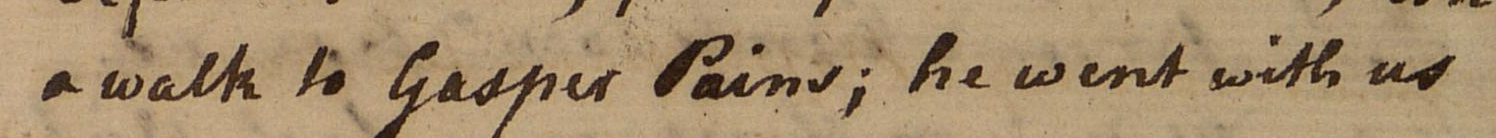walk to Gasper Pains; he went with us
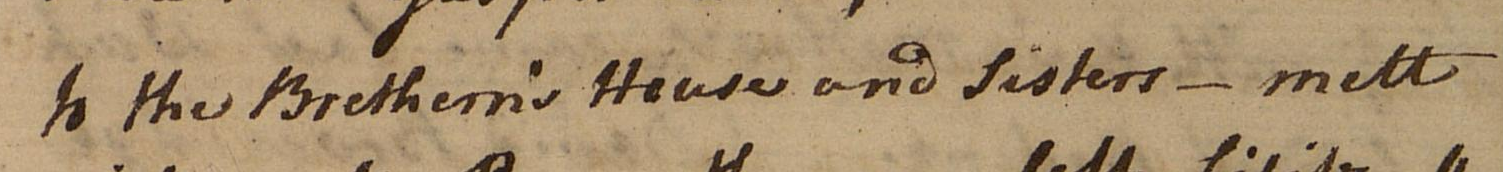to the Brethern's House and Sisters- mitt
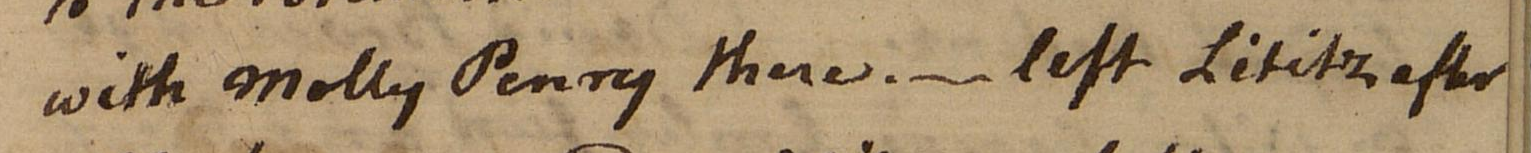with Molly Penny there.- left Lititz after
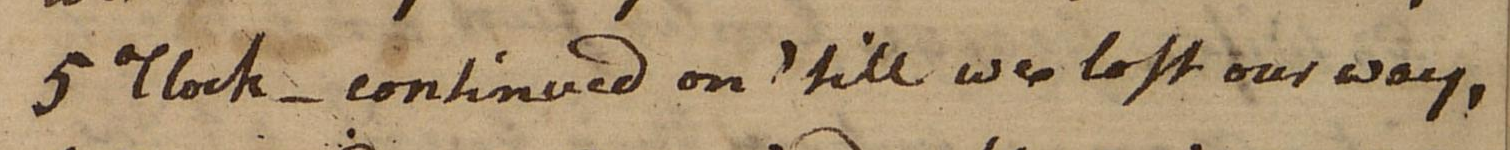5 ^oClock- continued on ' till we lost our way,
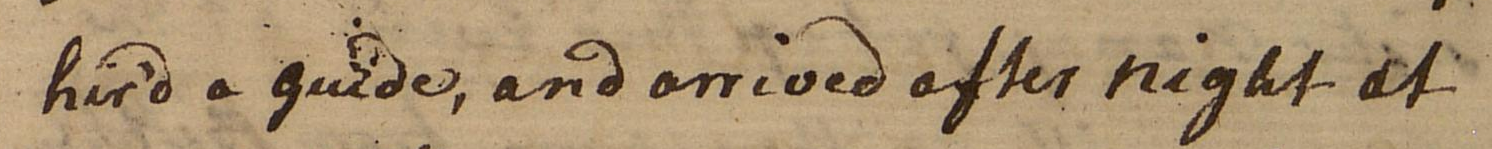hir'd a guide, and arrived after night at
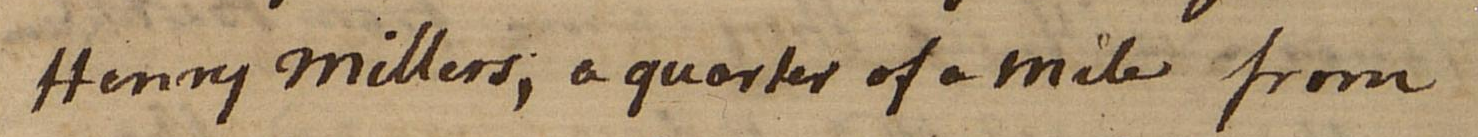Henry Millers; a quarter of a mile from
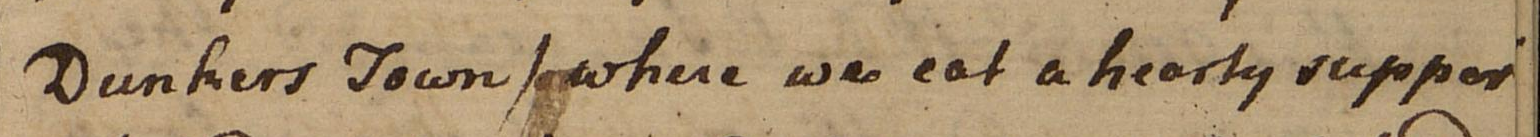Dunkers Town /where we eat a hearty supper
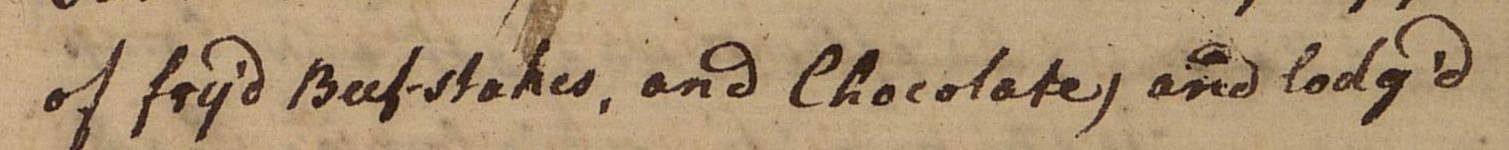of fry'd Beef-stakes, and Chocolate/ and lodg'd
